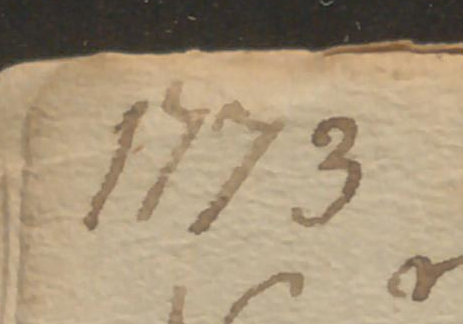1773
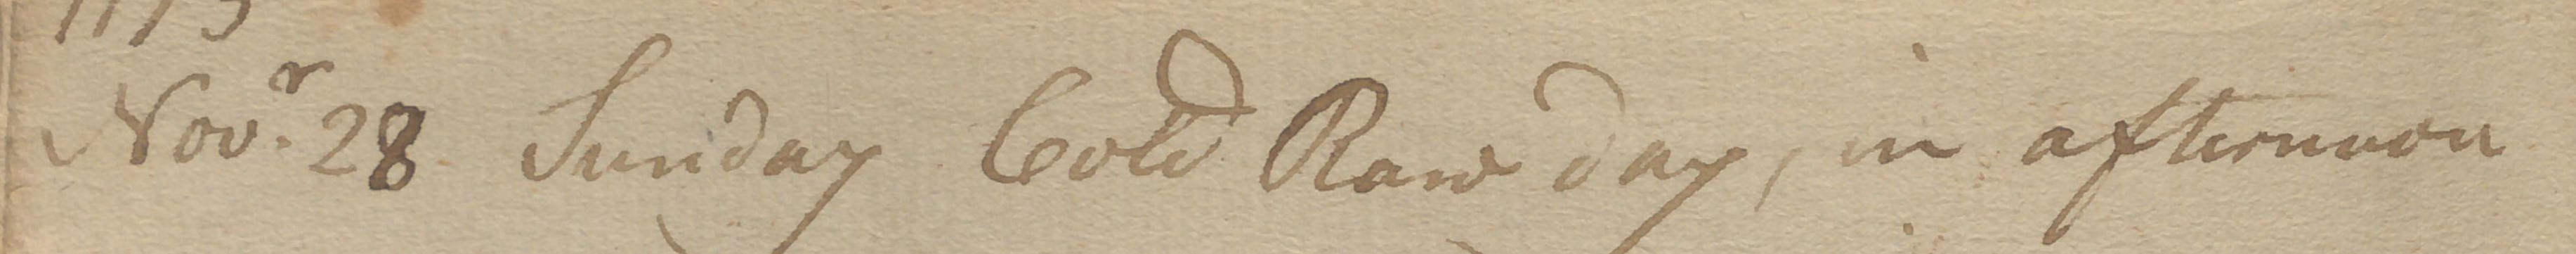Nov^r. 28 Sunday Cold Raw day, in afternoon
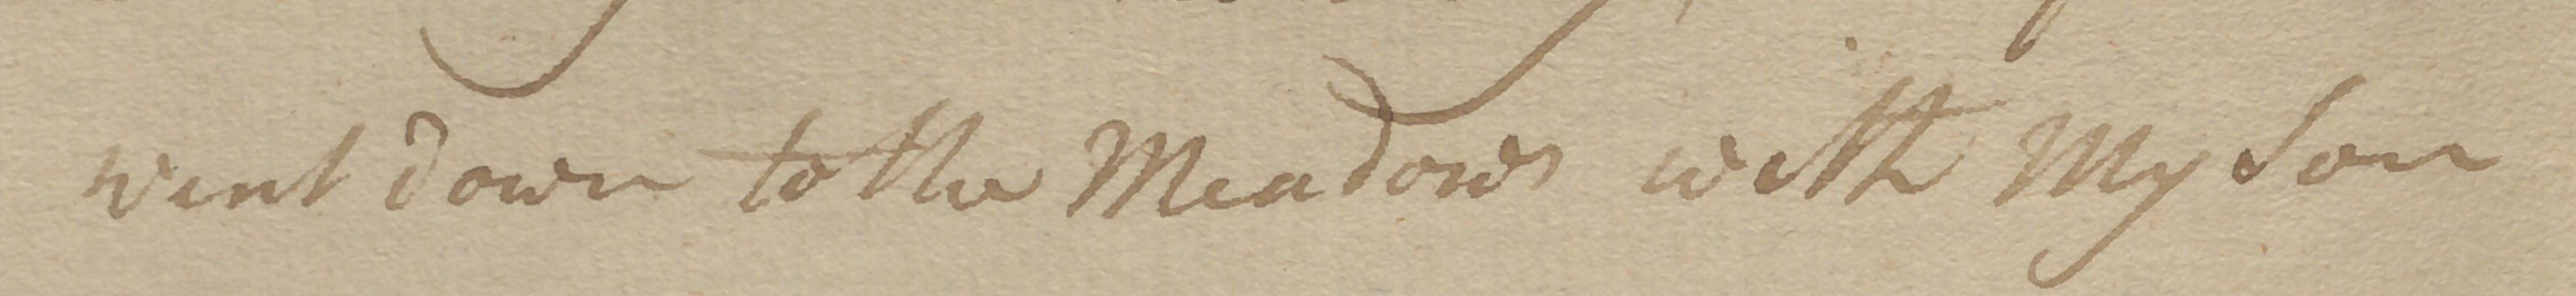went down to the Meadows with My Son
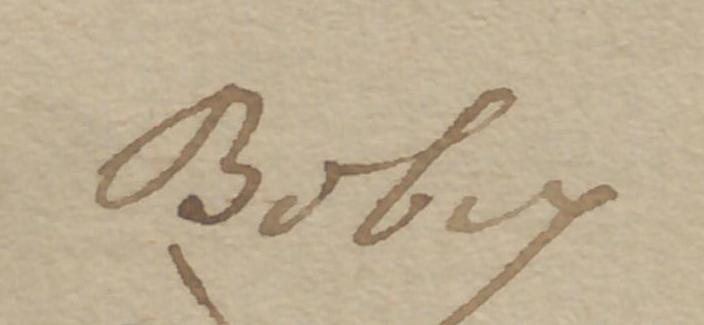Bobey
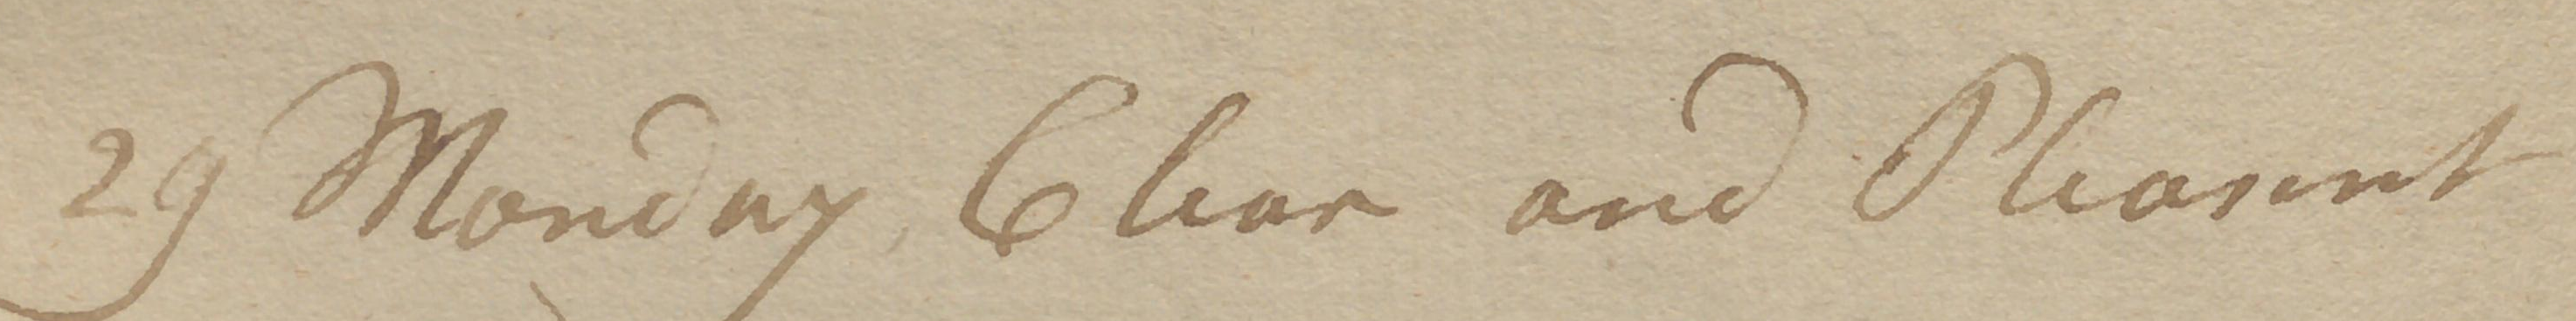29 Moneay Clear and Pleasent
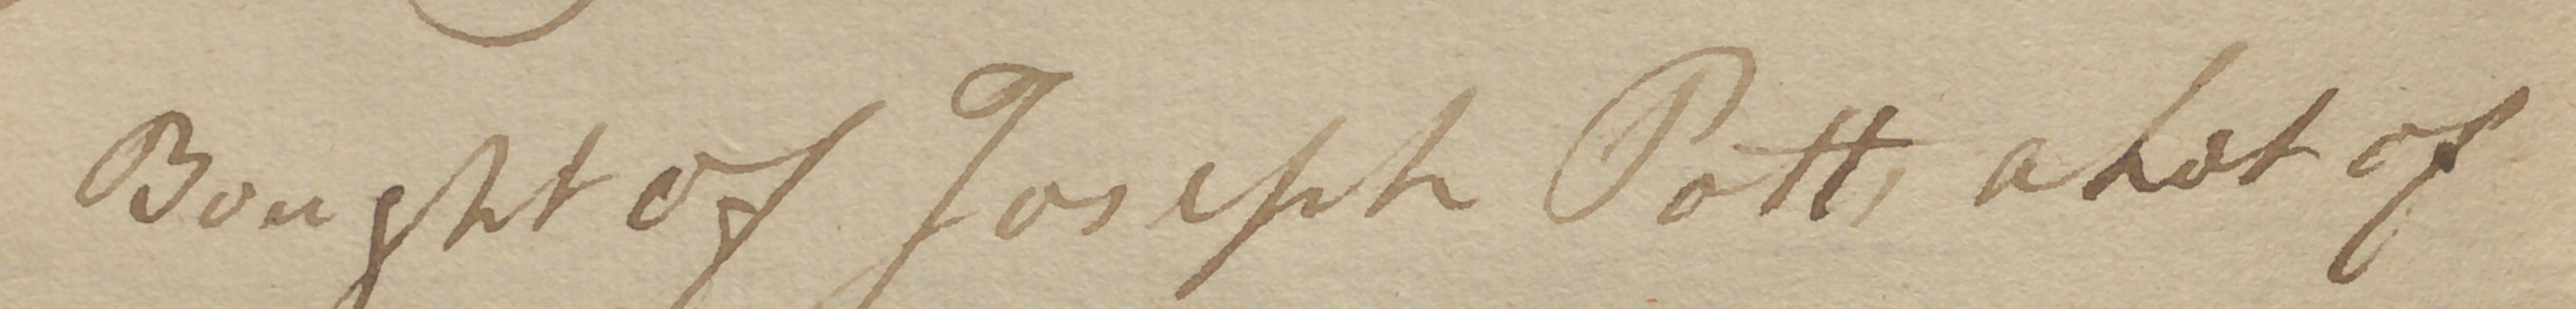Bought of Joseph Potts a Lot of
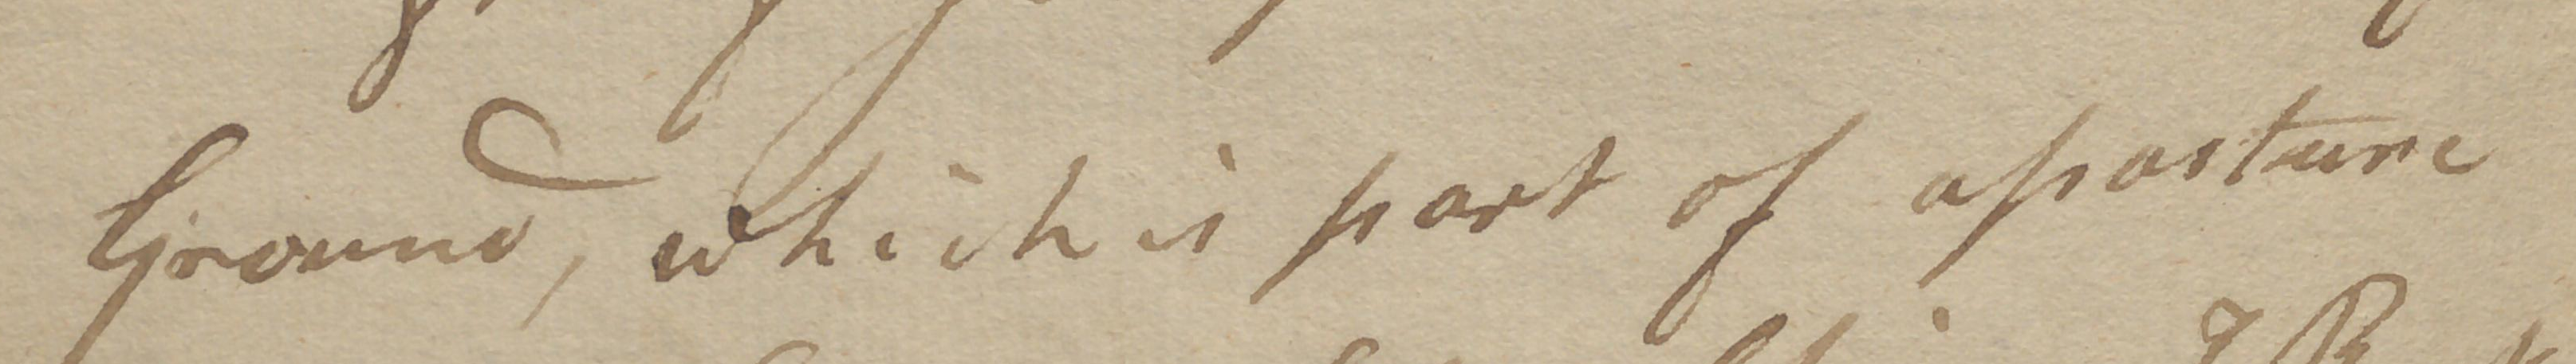Ground, which is part of a pasture
